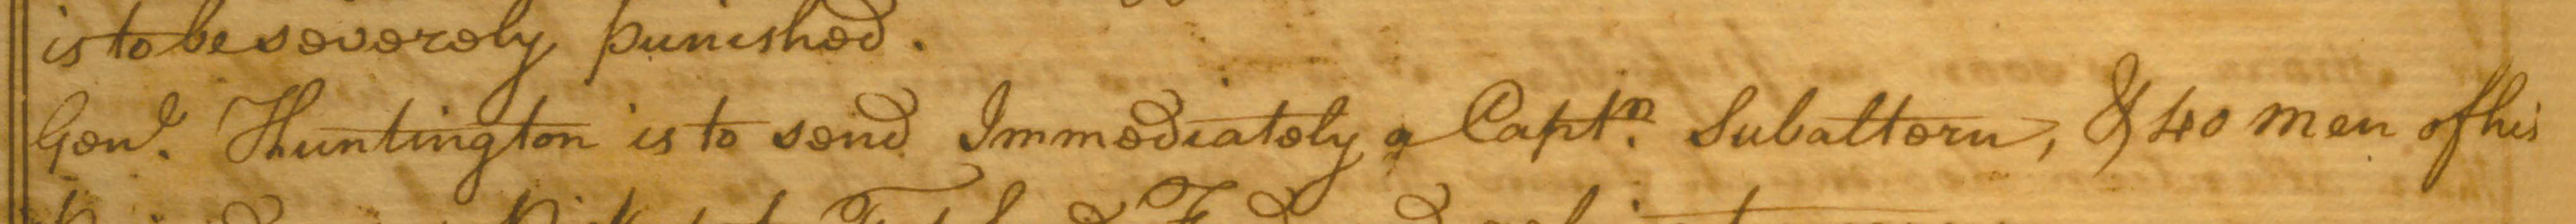Gen^l. Huntington is to send Immediately a Capt^n. Subaltern, & 40 men of his
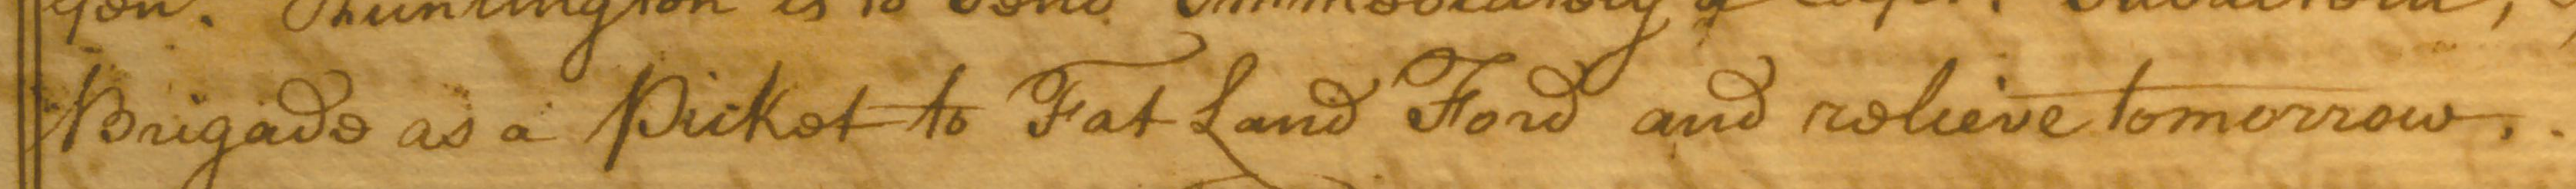Brigade as a Picket to Fat Land Ford and relieve tomorrow.
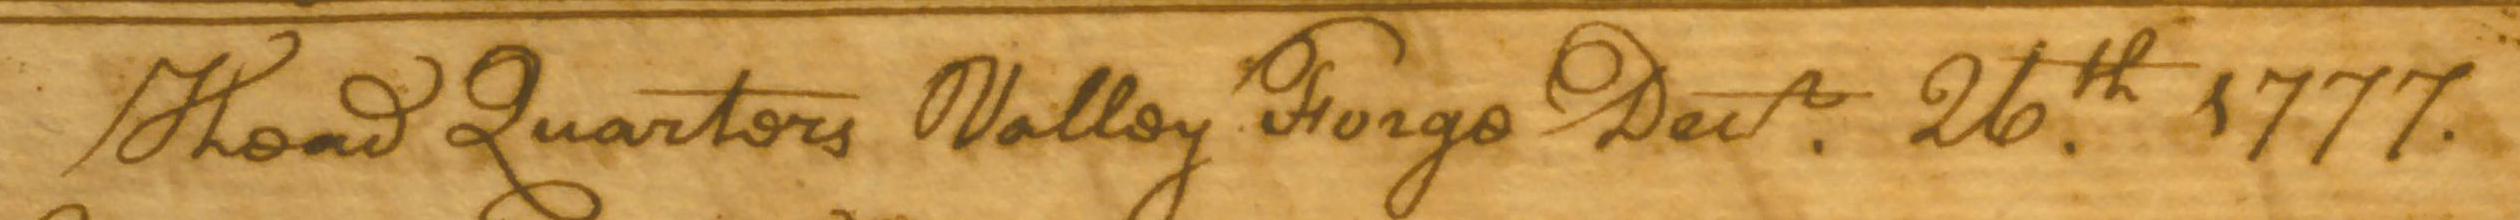Head Quarters Valley Forge Dec^r. 26^th. 1777.
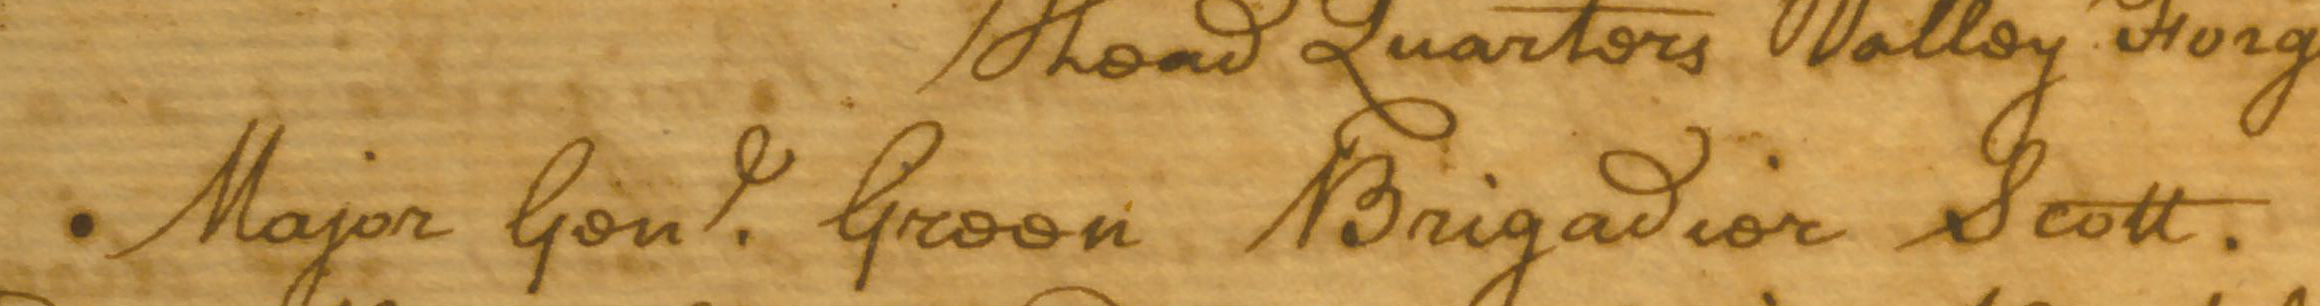Major Gen^l. Green Brigadier Scott.
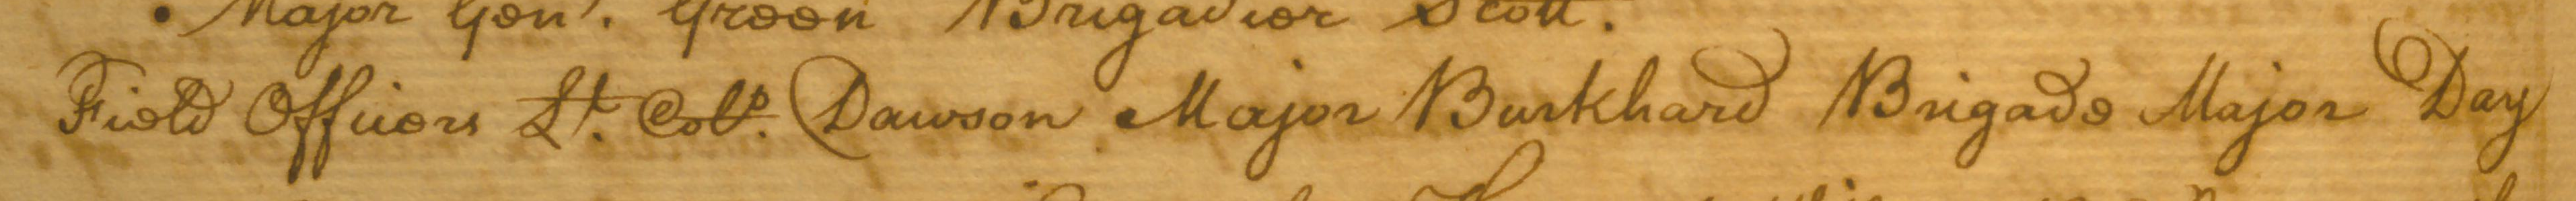Field Officers L^t. Col^o. Dawson Major Burkhard Brigade Major Day
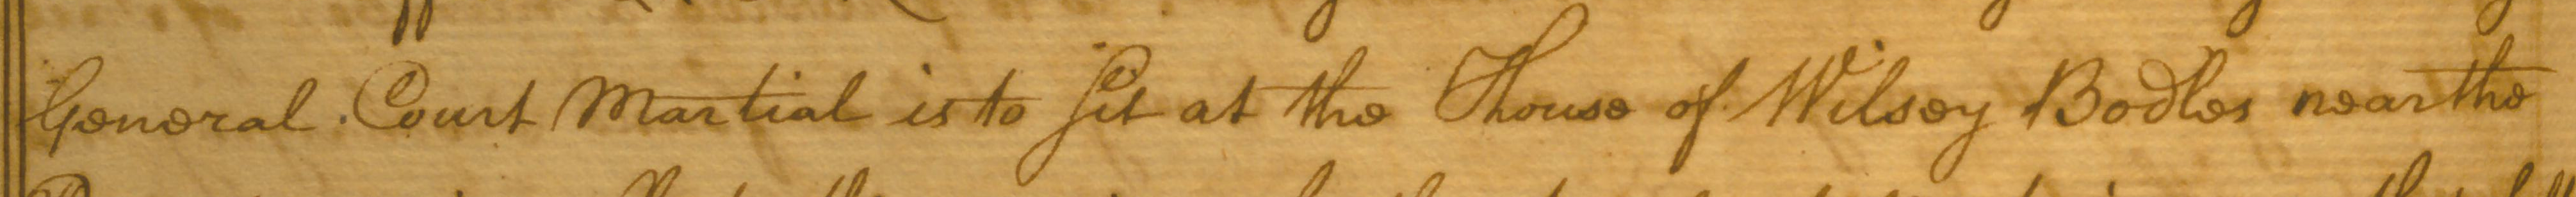General Court Martial is to sit at the House of Wilsey Bodles near the
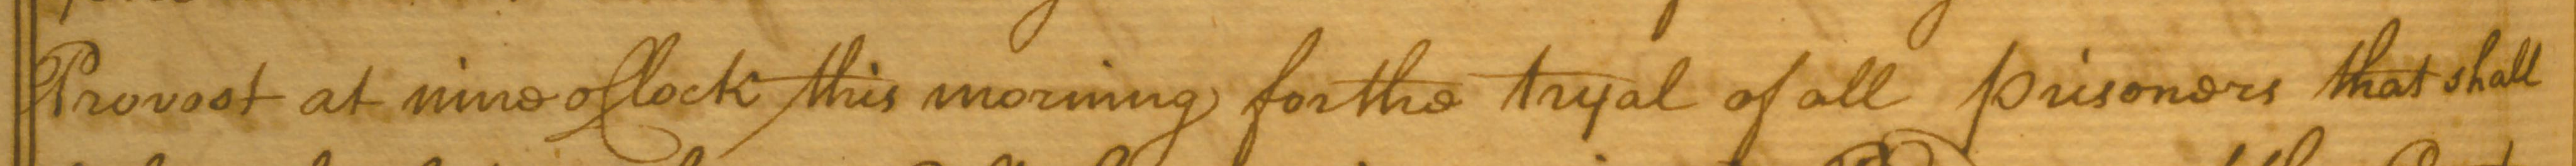Provost at nine oClock this Morning for the tryal of all prisoners that shall
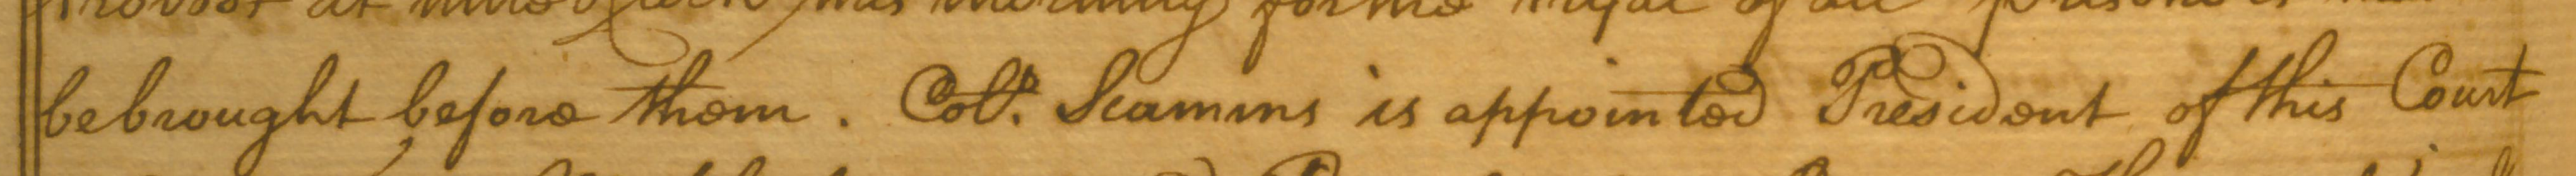be brought before them. Col^o. Seamins is appointed President of this Court
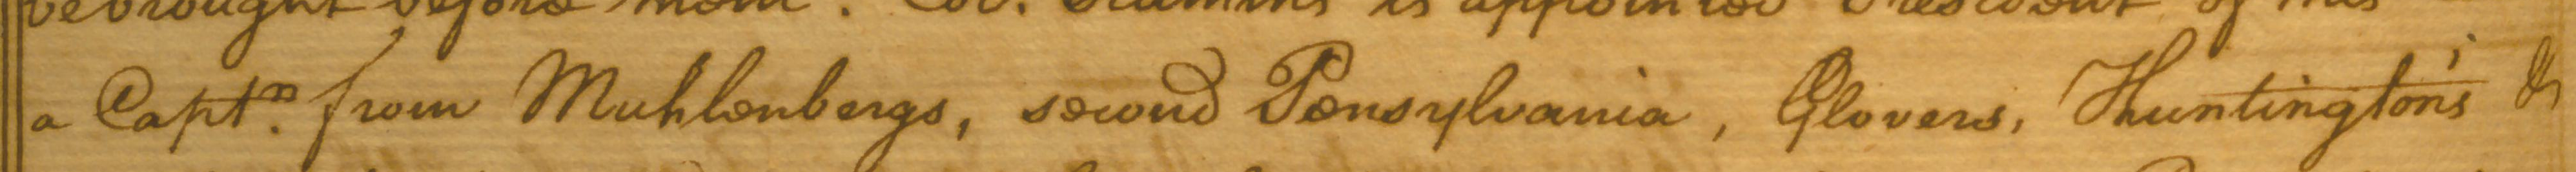a Capt^n. from Muhlenbergs, second Pensylvania, Glovers, Huntington's &
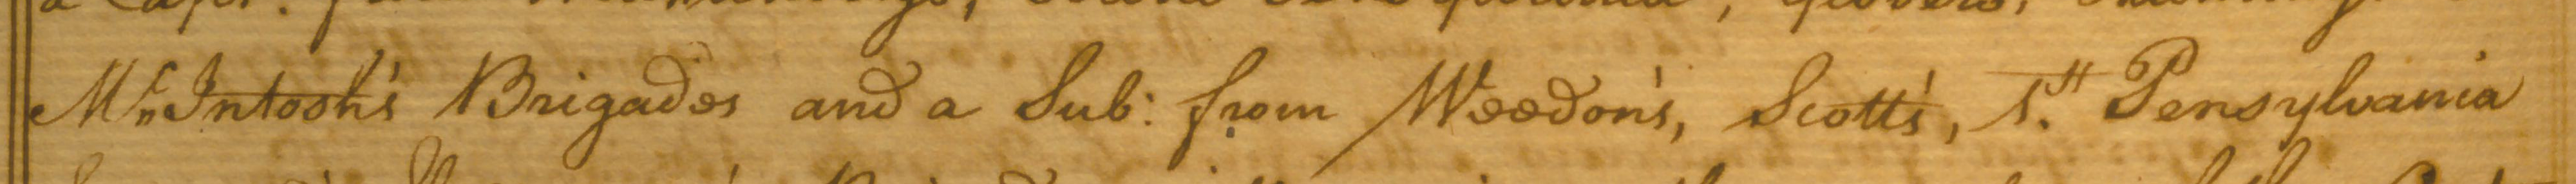M^c.Intosh's Brigades and a Sub: from Weedon's, Scott's, 1^st. Pensylvania
